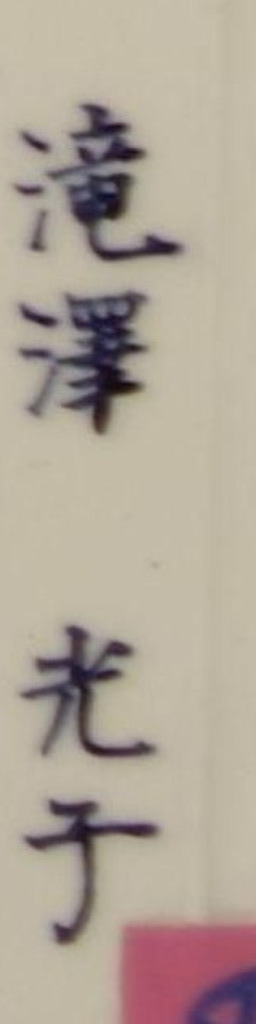滝沢光子
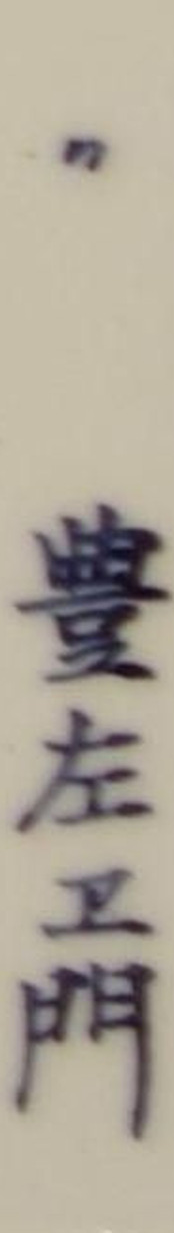豊左ヱ門
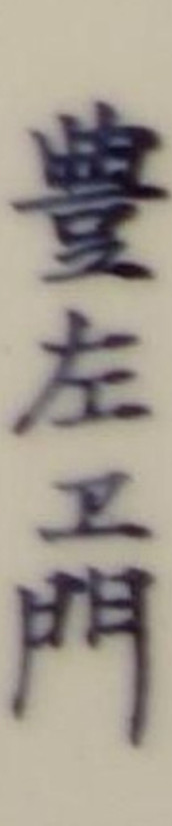豊左ヱ門
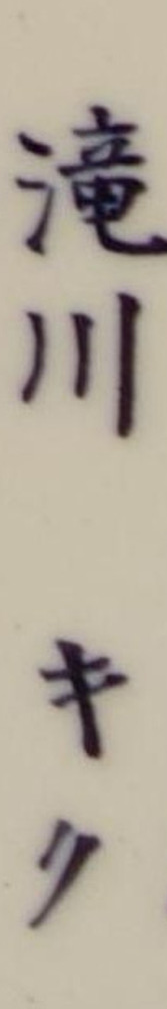滝川キク
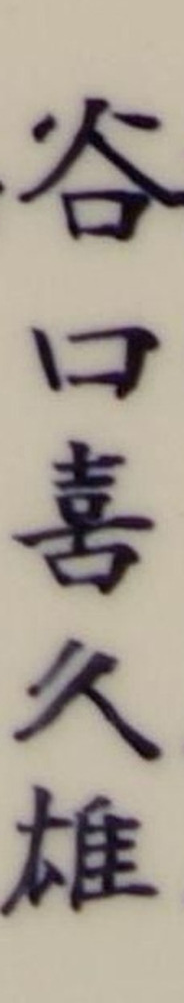谷口喜久雄
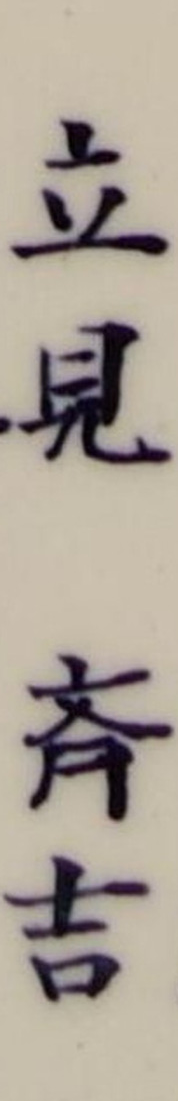立見斉吉
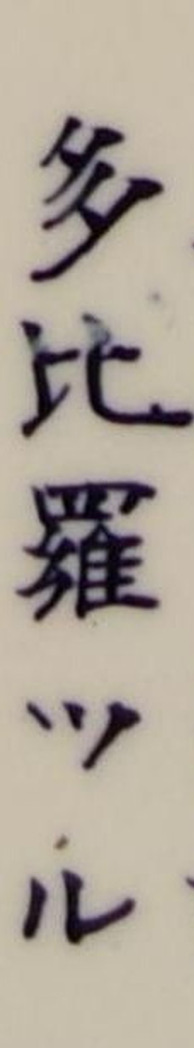多比羅ツル
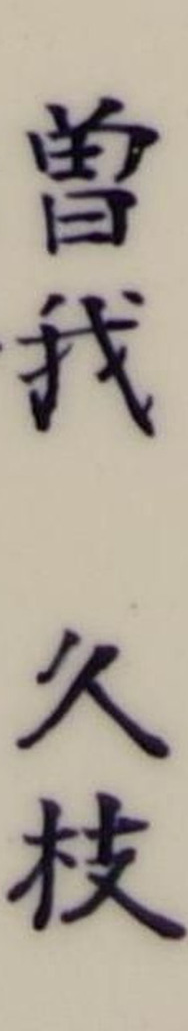曽我久枝
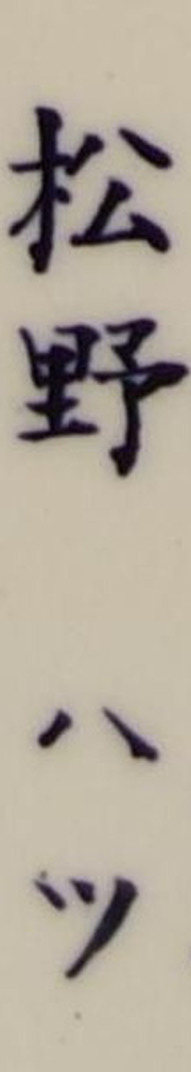松野ハツ
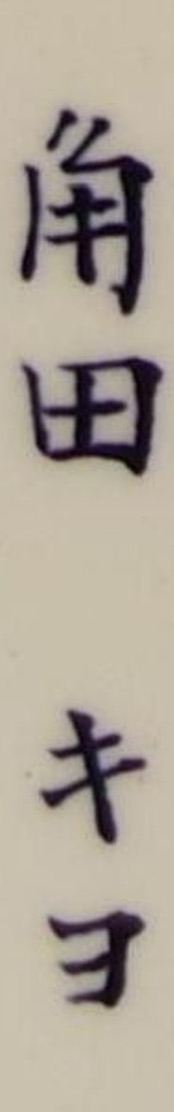角田キヨ
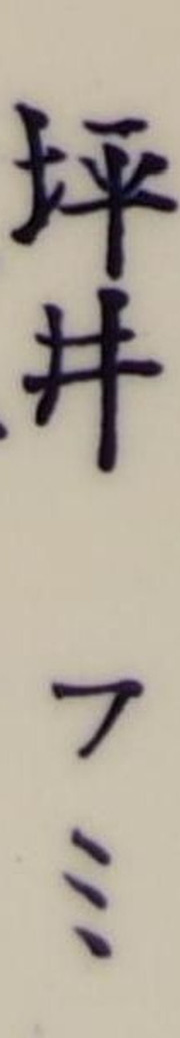坪井フミ
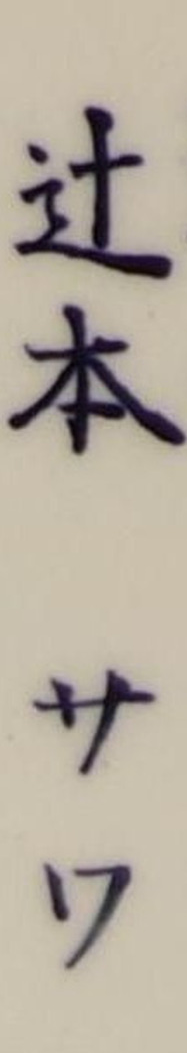辻本サワ
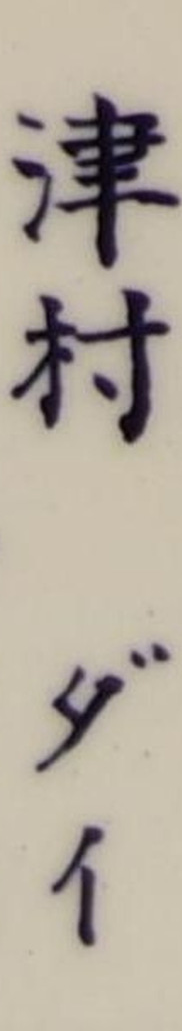津村ダイ
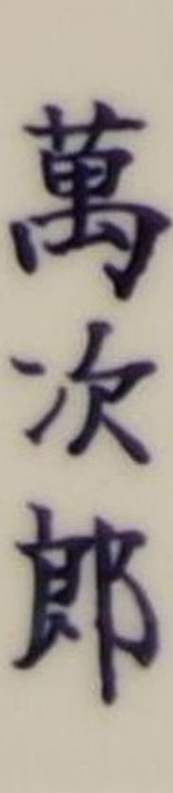萬次郎
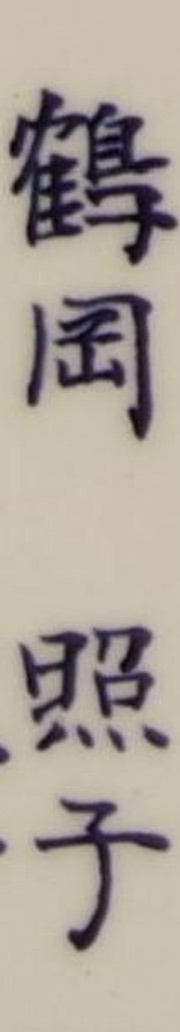鶴岡照子

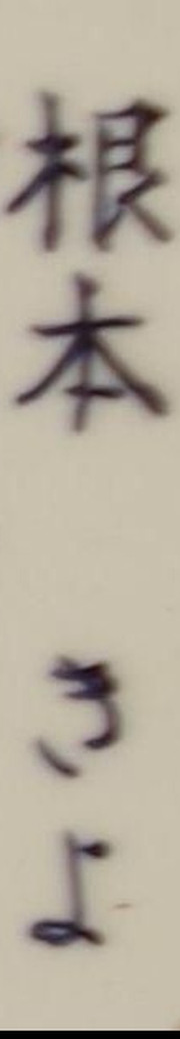根本きよ
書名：M~S
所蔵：高野山金剛峯寺
